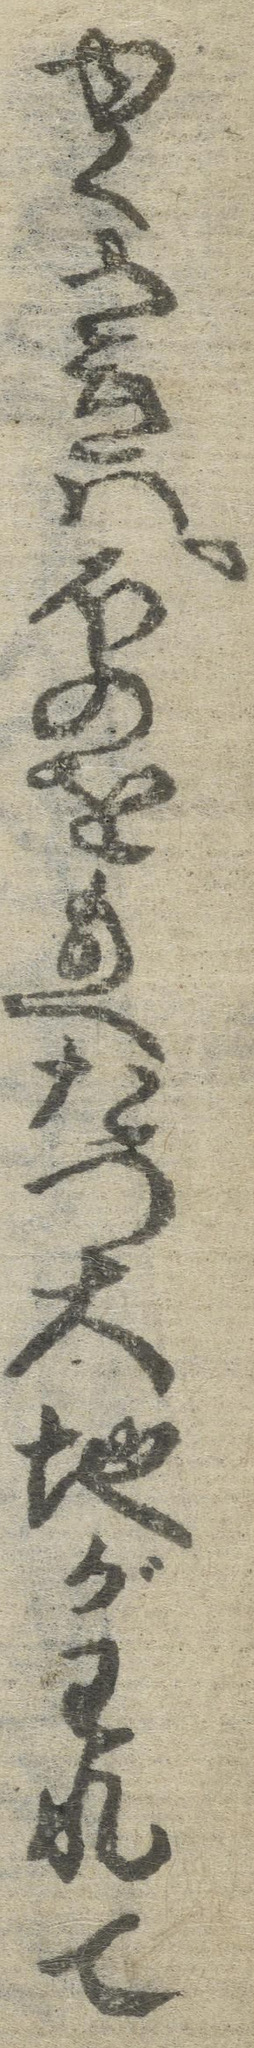ゆくさきは。ほのをもへたつ大地がわれて
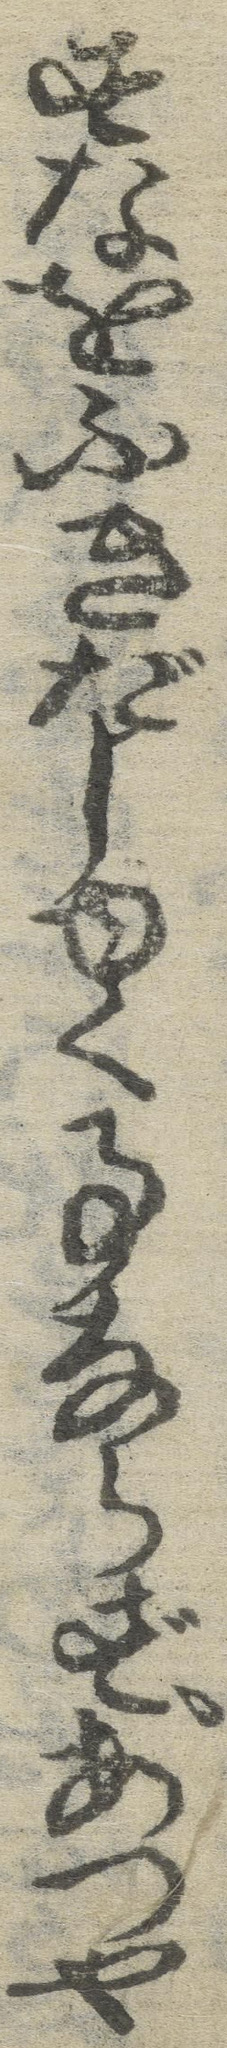すなをふきだしゆく事ならず。あつや
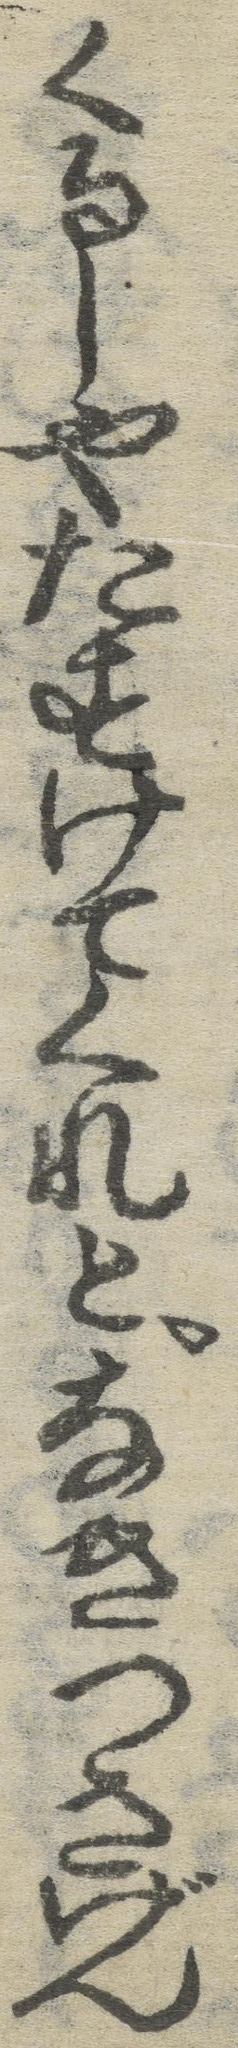くりしやたすけてくれと。なきつさげん
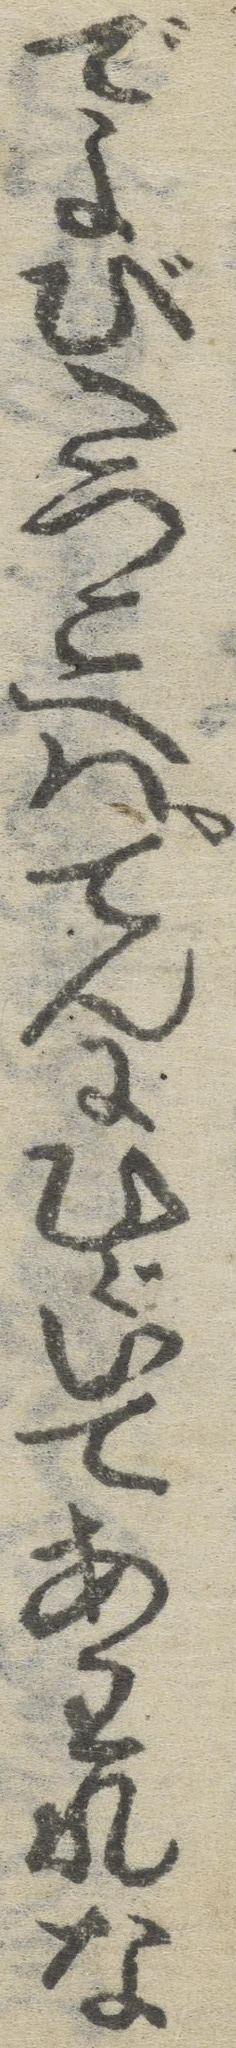でよびたつこへは。てんにひゞいてあわれな
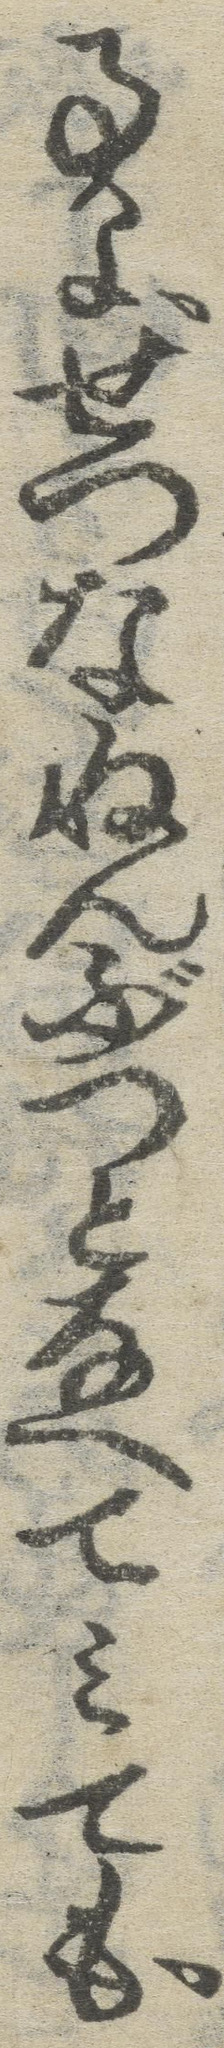事よ。せつなねんぶつとなへてみても。
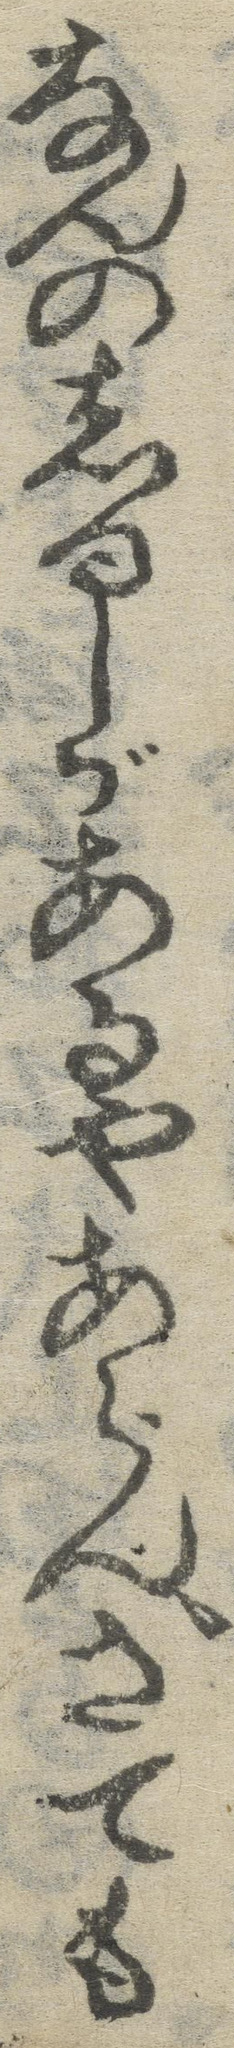なんのしるしがあるやあらん。さても
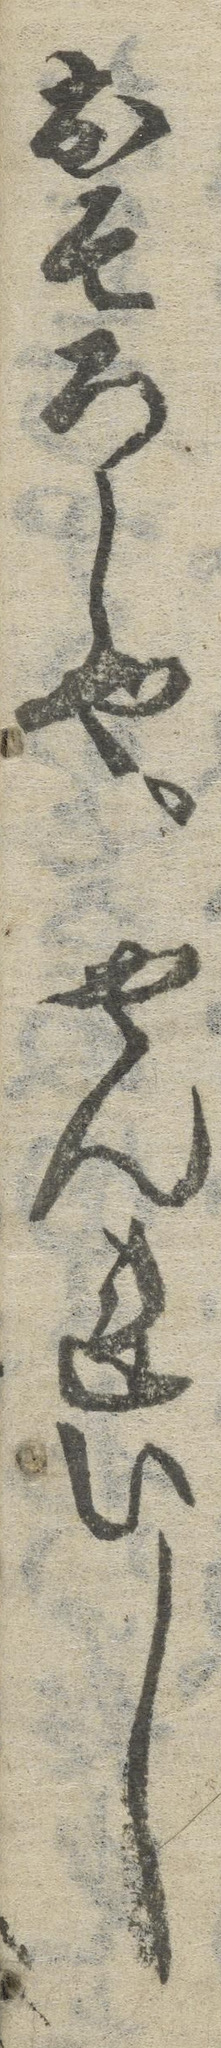おそろしや。やんれい〳〵
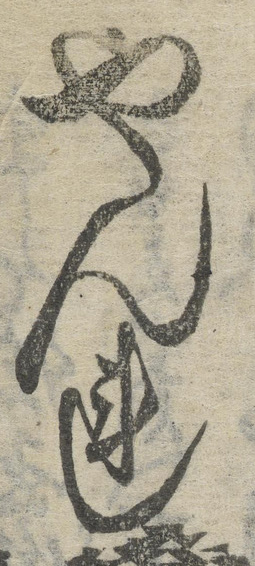やんれ

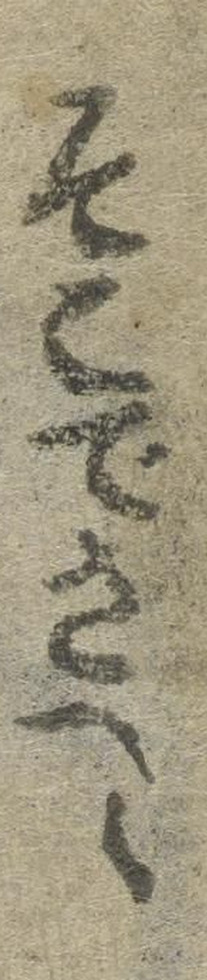そこでさへゝ
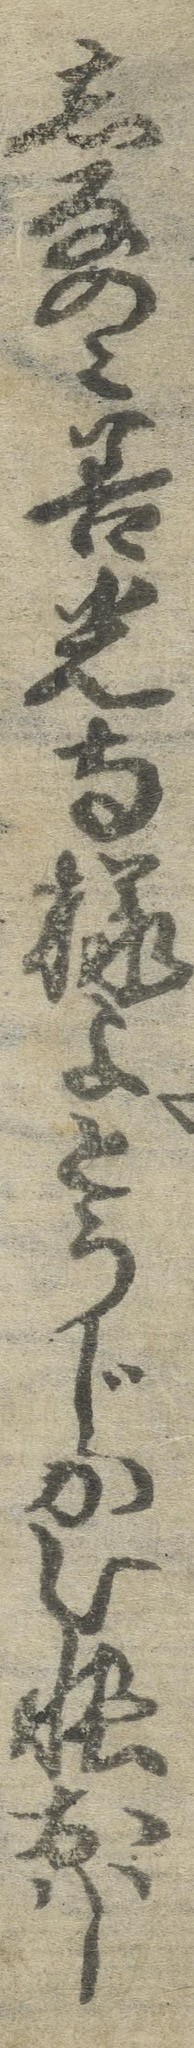しなのゝ善光寺様よ。とうじかひ帳おはし
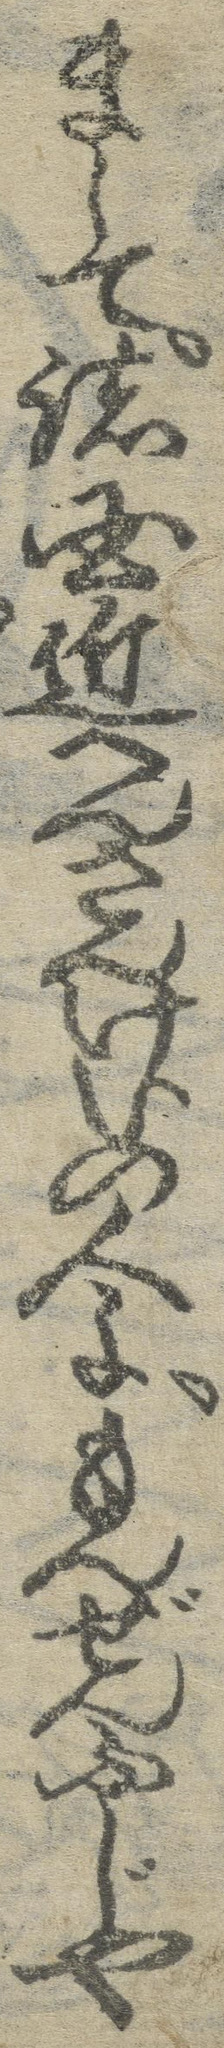まして。諸国近へんさんけいの人よ。もんぜんふじや
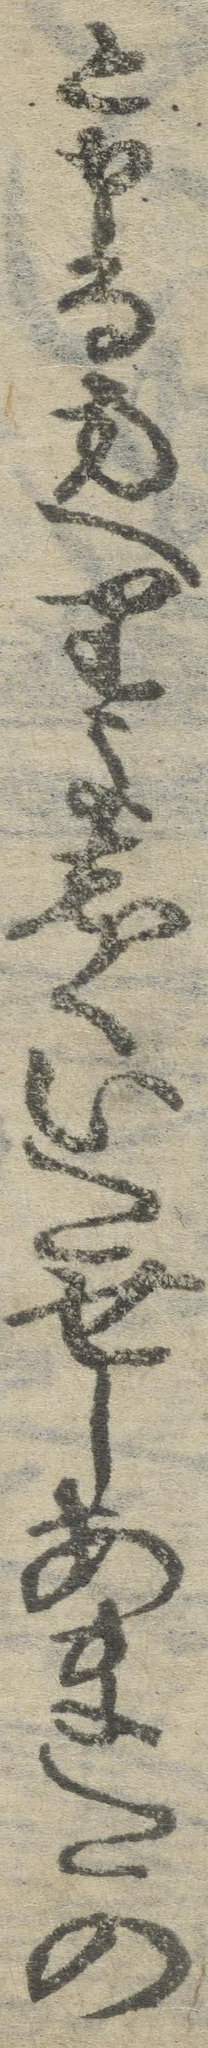と申る方へ。りよしくいたせしあまたの
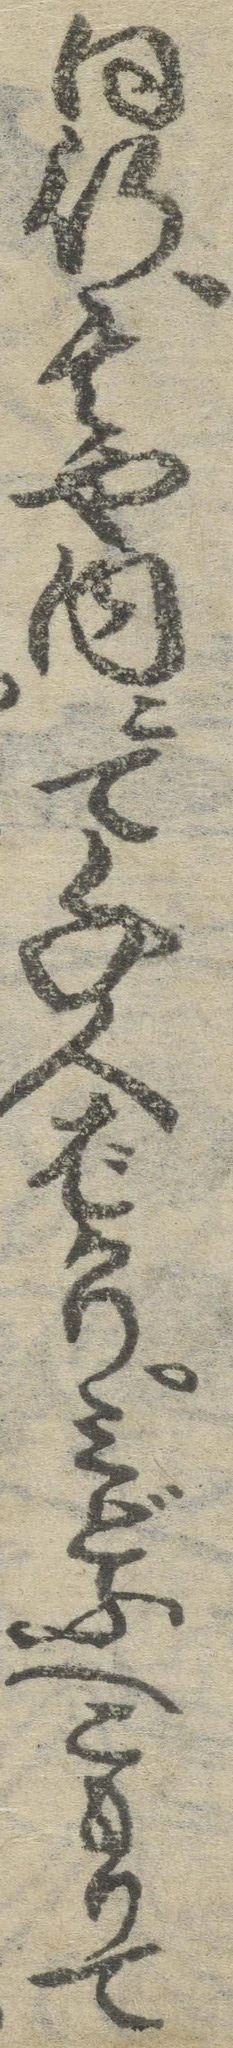向行、其や内ニて千人ばかり。みどふへこもりて
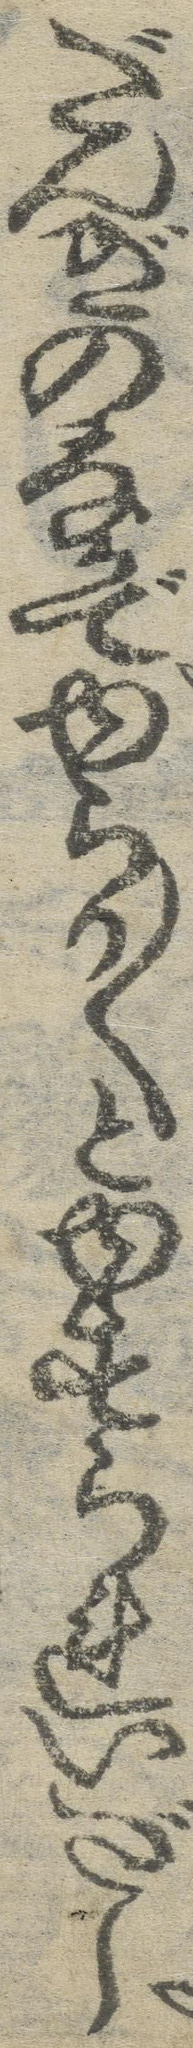だんぎのなかで。ゆらり〳〵とゆすられいだし。
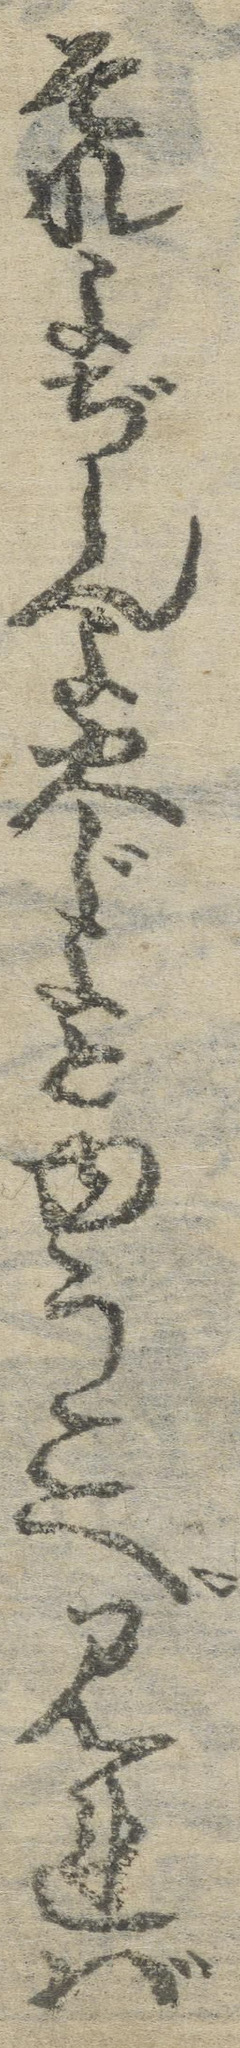それよぢしんよ火じよとゆうこへ。見れば
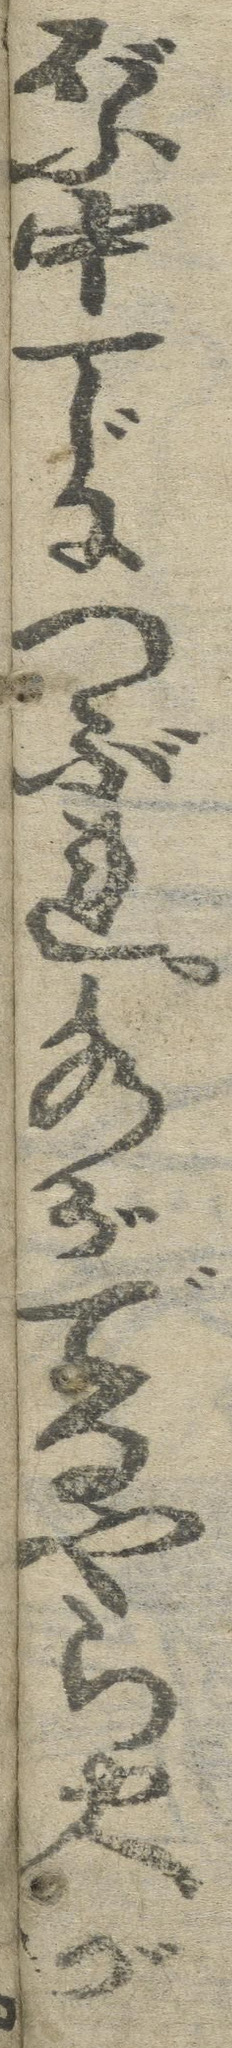ぼふ中一じにつぶれ。水がでるやら火が
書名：信州ぢしんやんれぶし　上・下
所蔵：東京大学地震研究所図書室 Earthquake Research Institute Library, The University of Tokyo, JAPAN
